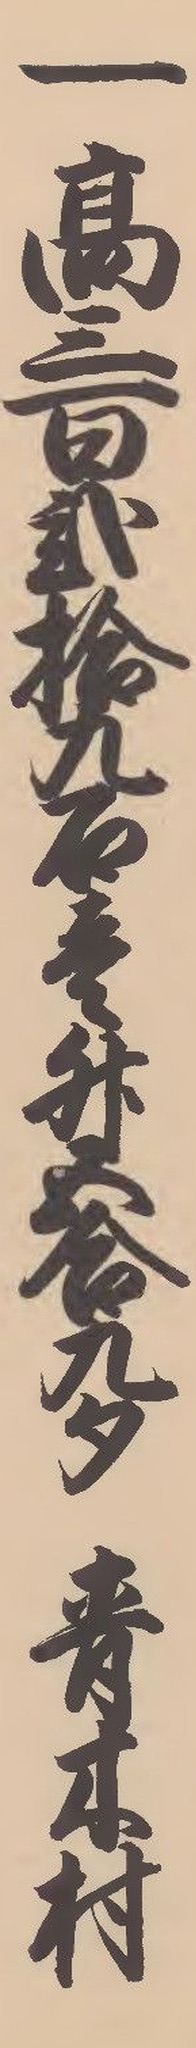一高三百弐拾九石壱升五合九勺青木村
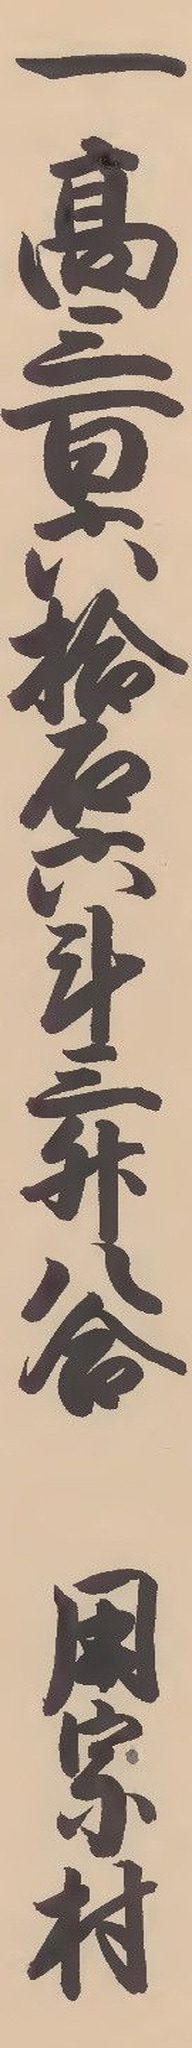一高三百六拾石六斗三升八合用宗村
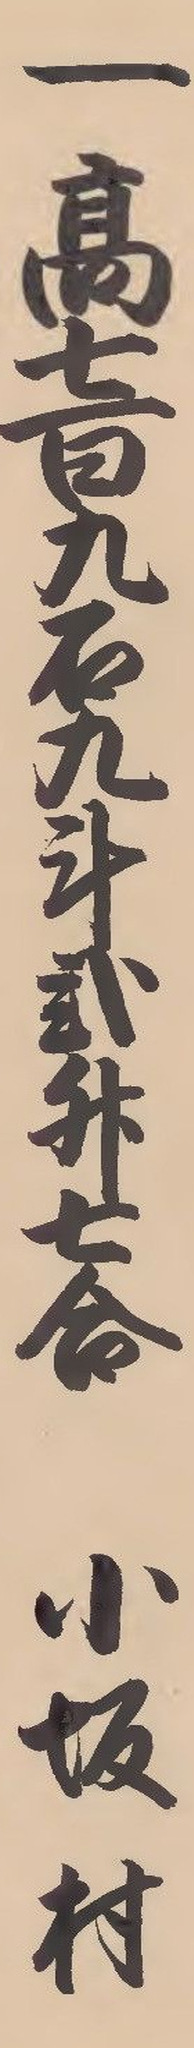一高七百九石九斗弐升七合小坂村
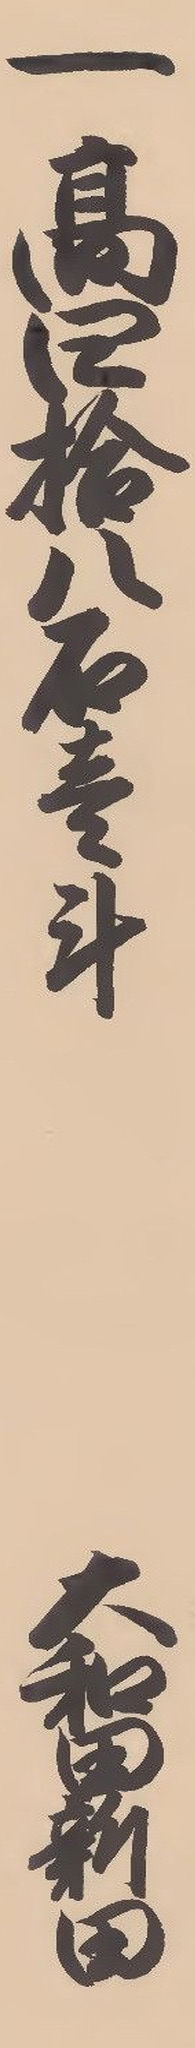一高四拾八石壱斗大和田新田
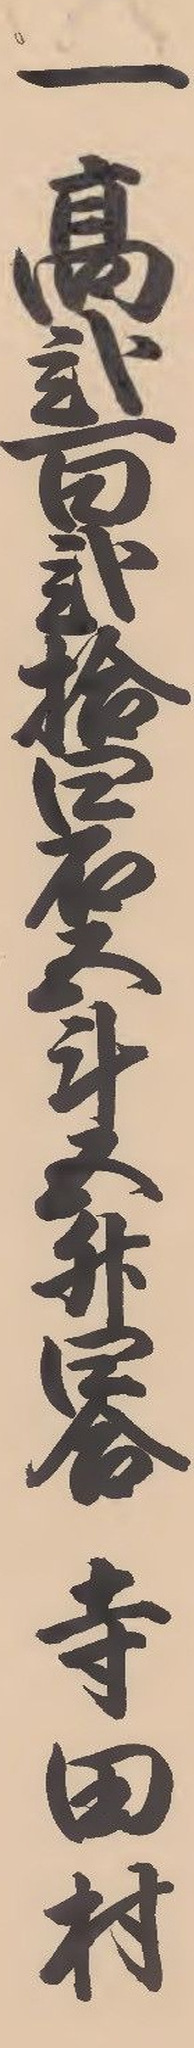一高弐百弐拾四石五斗五升四合寺田村
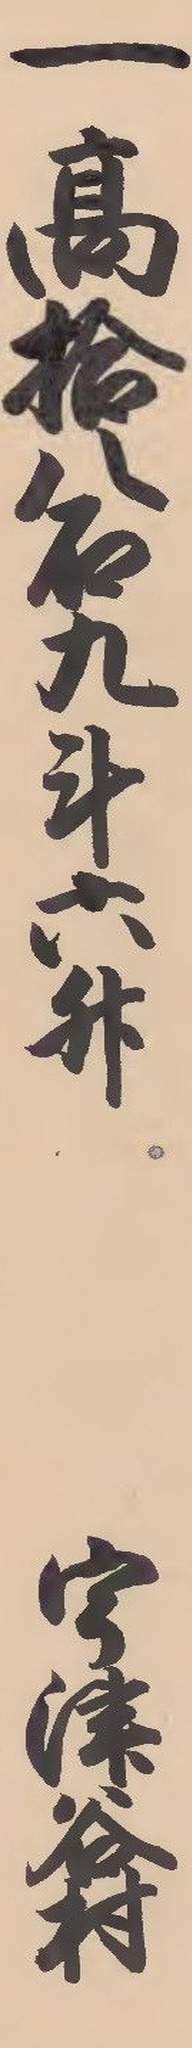一高拾八石九斗六升宇津谷村

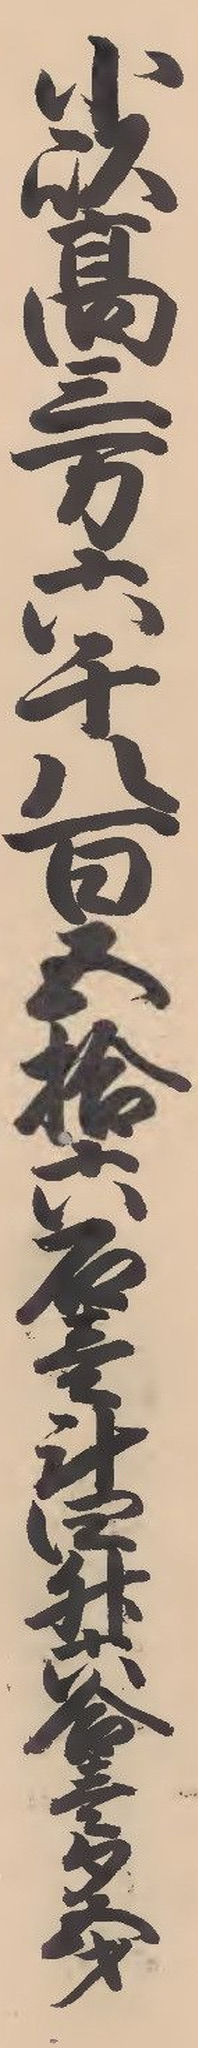小以高三万六千八百五拾六石壱斗四升六合壱勺五才
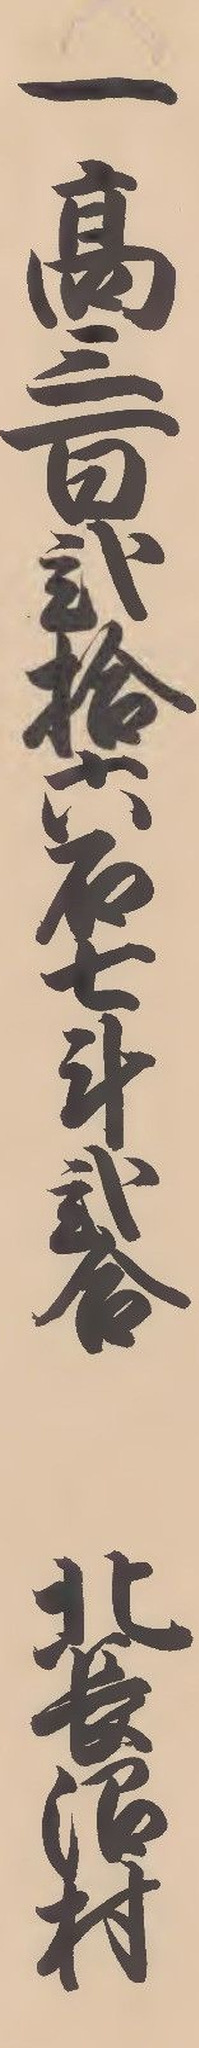一高三百弐拾六石七斗弐合北長沼村
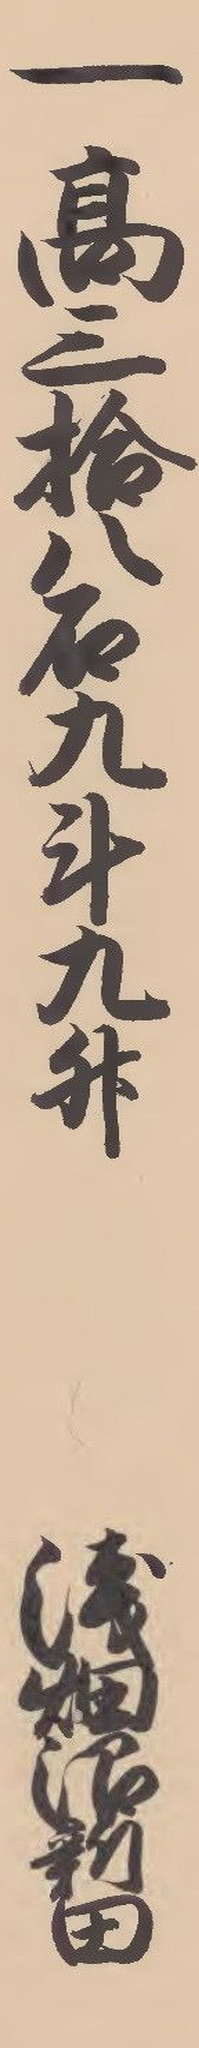一高三拾八石九斗九升浅畑沼新田
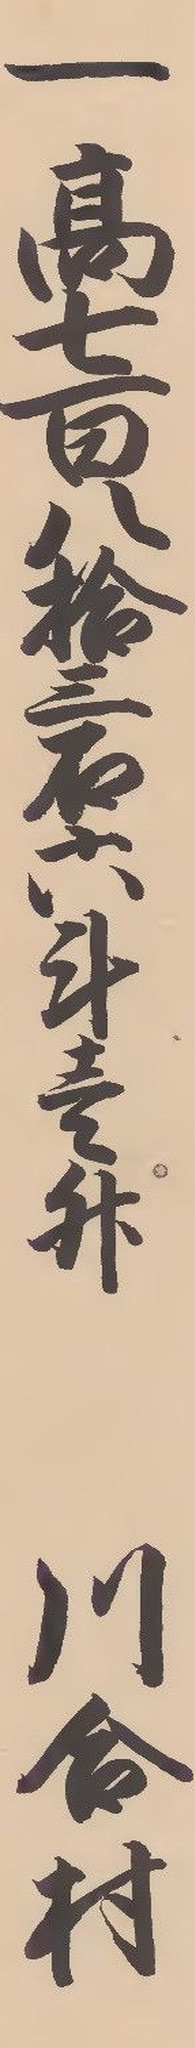一高七百八拾三石六斗壱升川合村

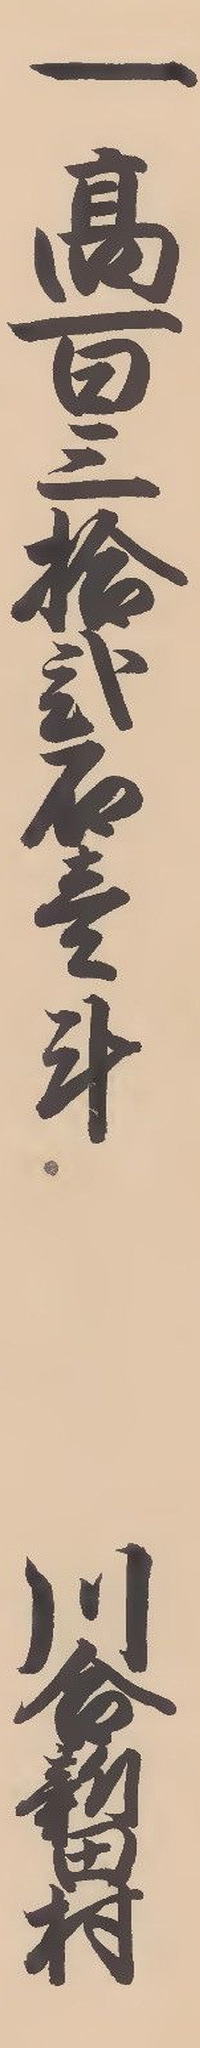一高百三拾弐石壱斗川合新田村
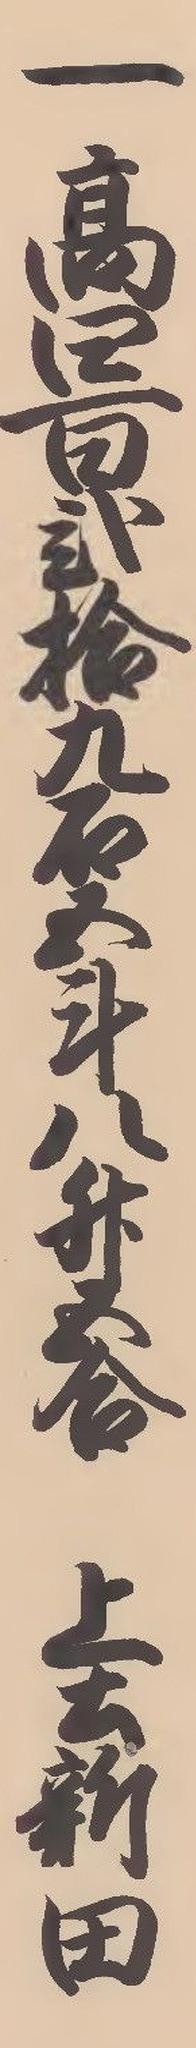一高四百弐拾九石五斗八升五合上土新田
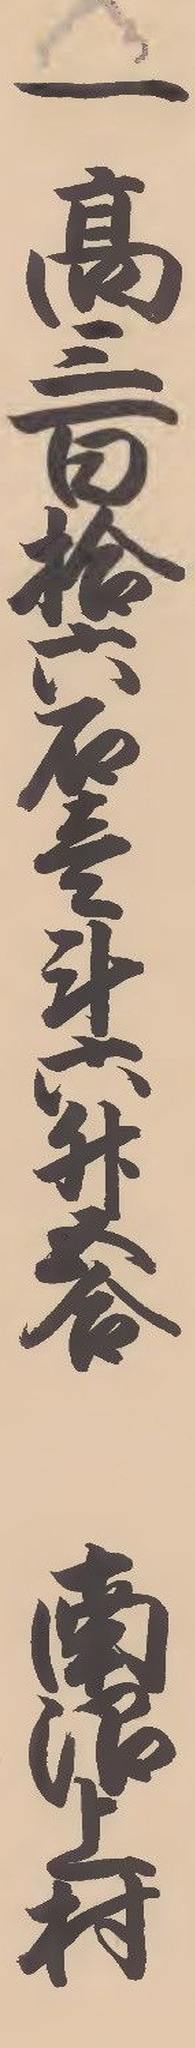一高三百拾六石壱斗六升五合南沼上村
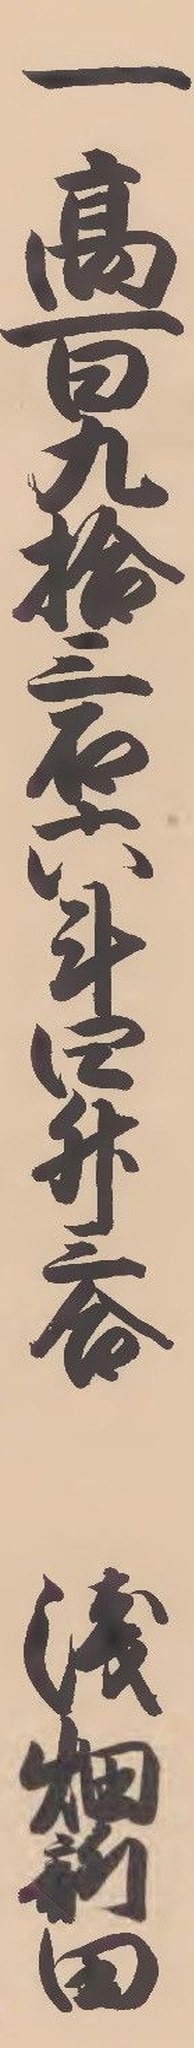一高百九拾三石六斗四升三合浅畑新田
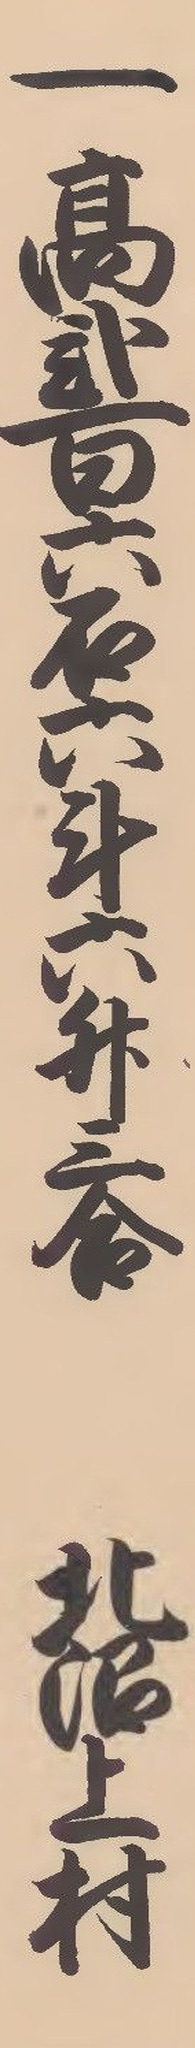一高弐百六石六斗六升三合北沼上村
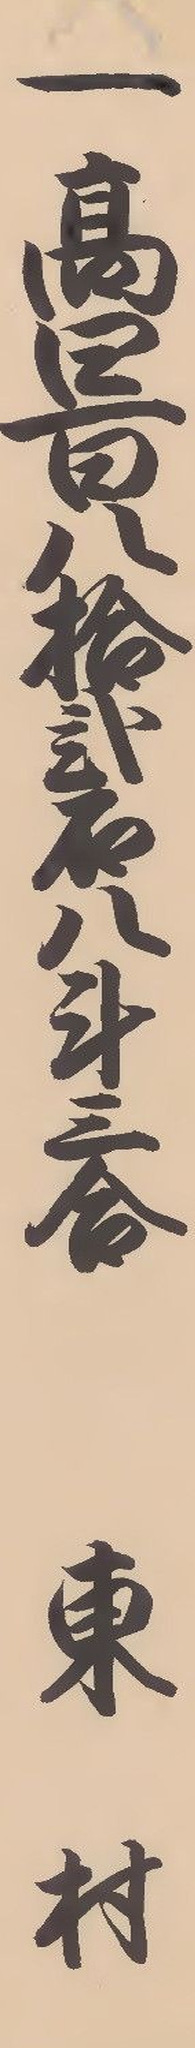一高四百八拾弐石八斗三合東村
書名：駿河国郷帳
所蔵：国立公文書館 National Archives of Japan
